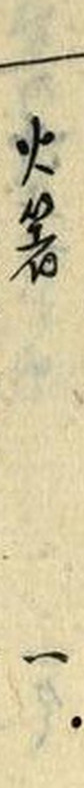火箸一
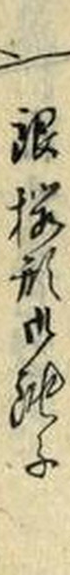銀桜形御銚子一

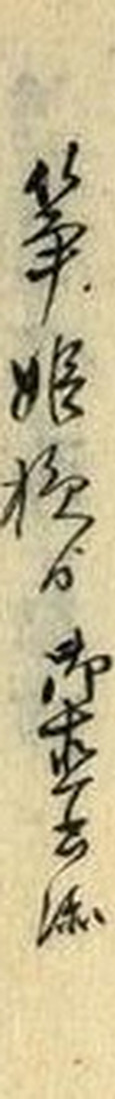箏姫様ゟ御直書添
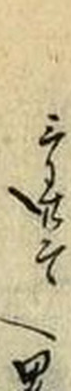三月廿二日
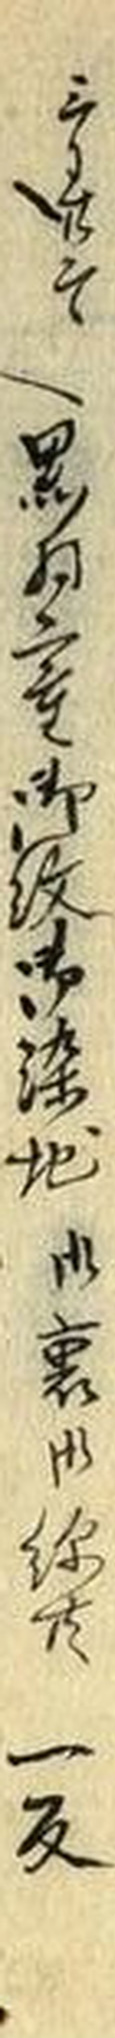黒羽二重御紋御染地御裏御綿共一反
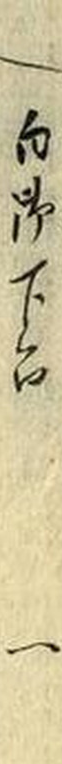白御下召一
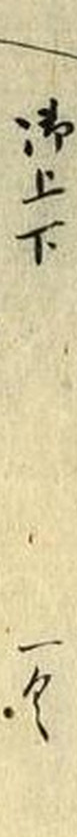御上下一具
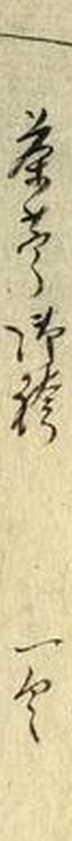茶苧御絝一具
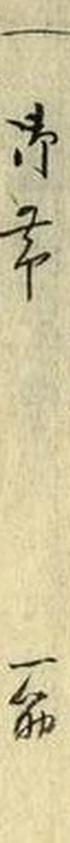御帯一筋
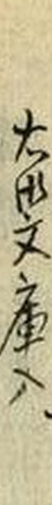右御文庫入
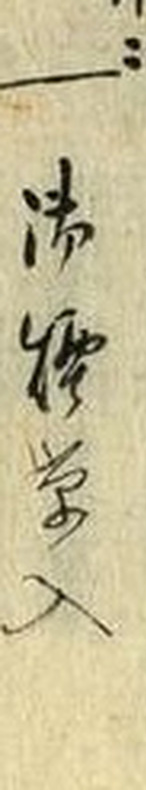御煙草入
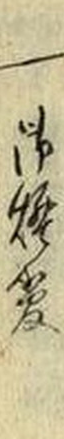御煙管
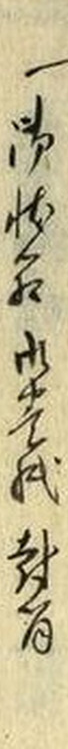御状箱御巻紙封筒
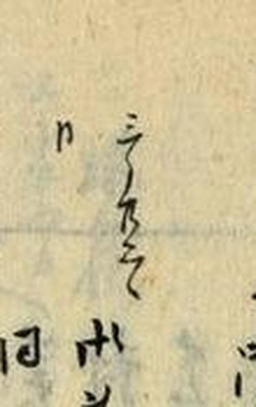三月廿二日
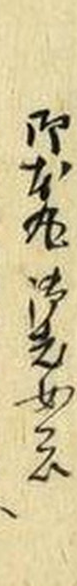同西丸御老女衆
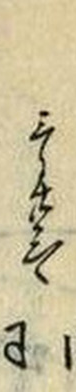三月廿三日
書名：少傅日録抄（斉承付側向頭取日記、在府）
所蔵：福井県文書館 Fukui Prefectural Archives
